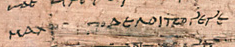μαχοϲτοδελοιπονενε
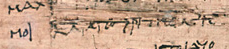μοι καιαποτριτηϲανη
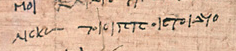λιϲκω τοιϲιπποιϲτοιδυο
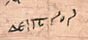δειπνον
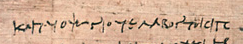καιτουοψωνιουελαβοντοιϲιπ
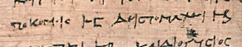ποκομοιϲ Ͱϲ αριϲτομαχωι Ͱβ
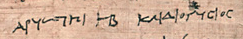αρυωτηι Ͱβ καιδιονυϲιοϲ
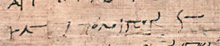ͰαⲺ / τολοιπον ∫Ⲻ
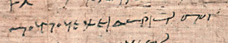τουτουεχειδωριωνοτον
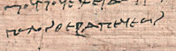πωλονθεραπευων
